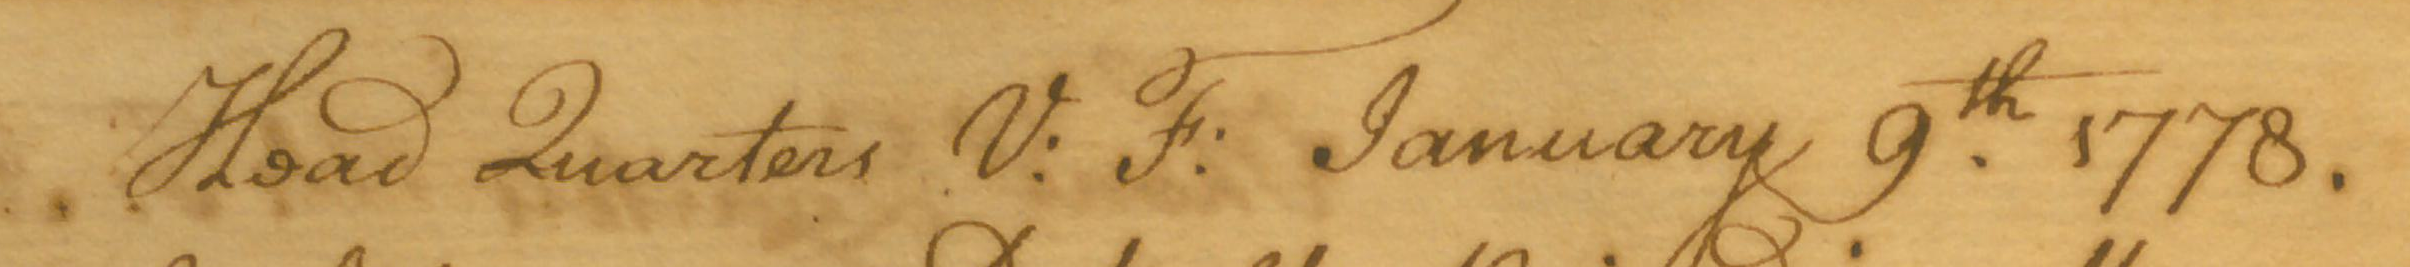Head Quarters V: F: January 9^th. 1778.
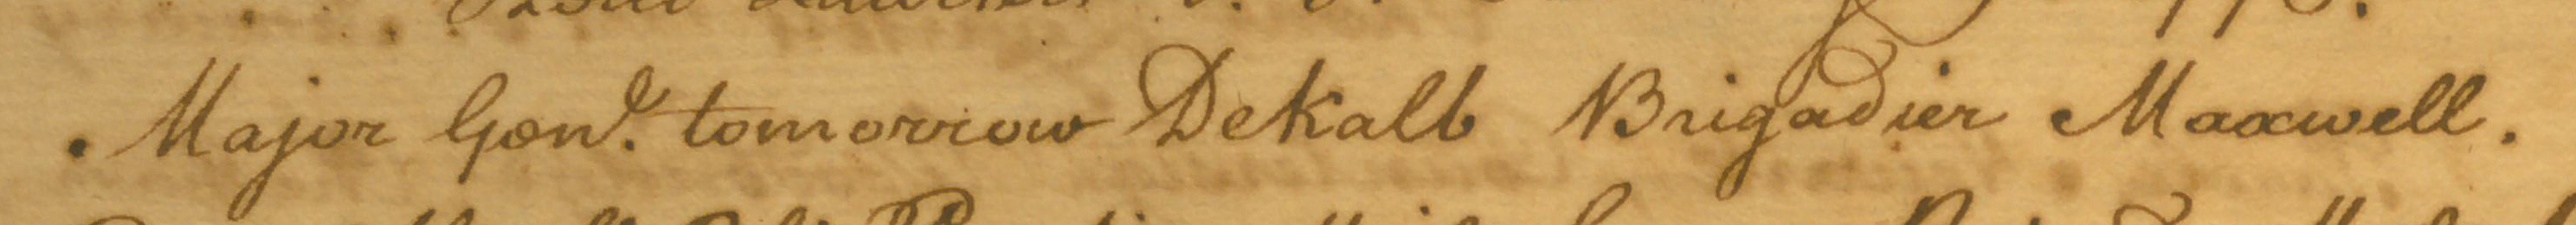Major Gen^l. tomorrow DeKalb Brigadier Maxwell.
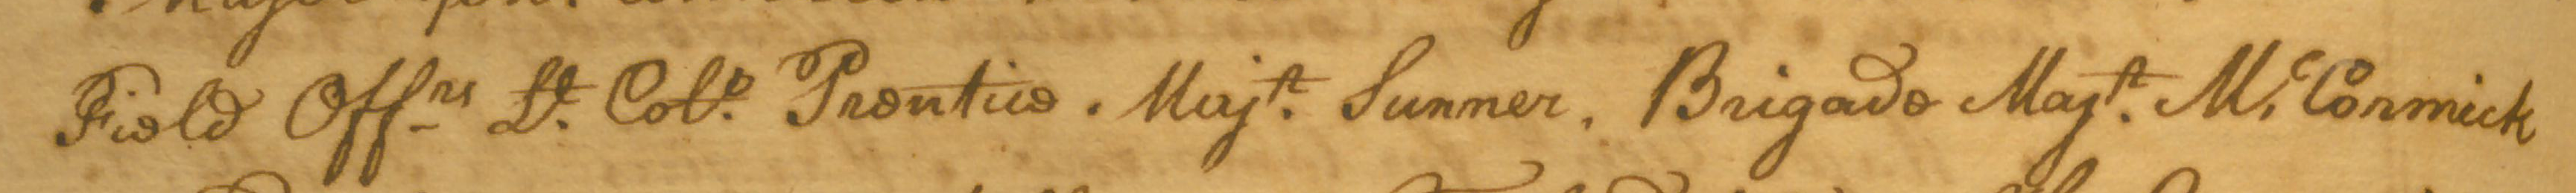Field Off^rs. L^t. Col^o. Prentice. Maj^r. Sumner. Brigade Maj^r. M^c.Cormick
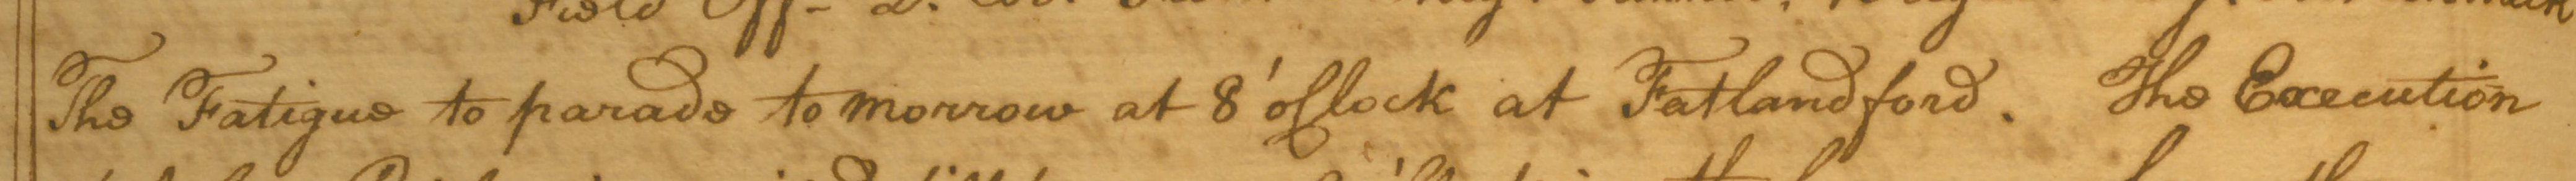The Fatigue to parade toorrow at 8 'oClock at Fatlandford. The Execution
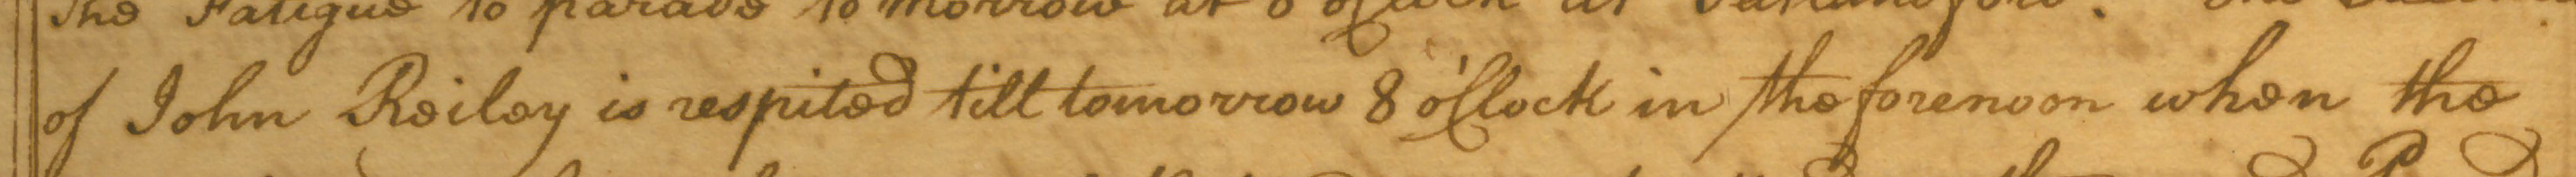of John Reiley is respited till tomorrow 8 o'Clock in the forenoon when the
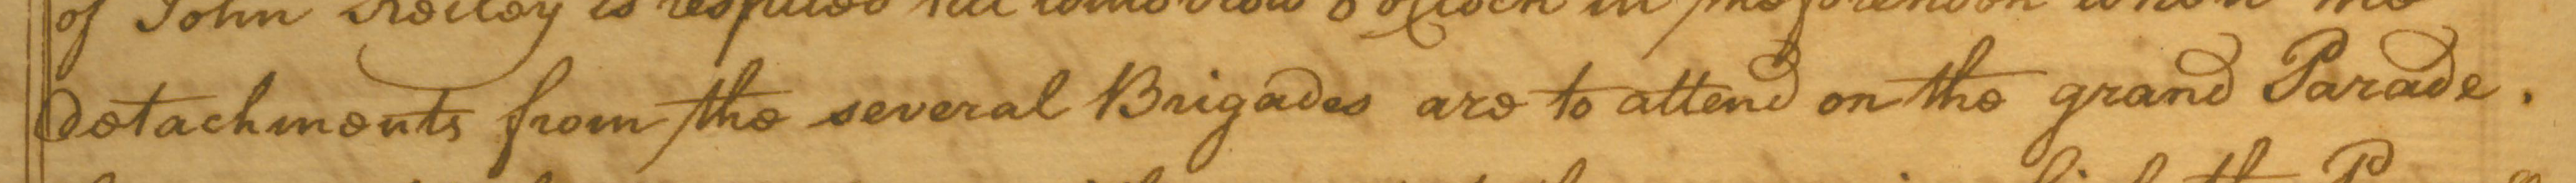detachments from the several Brigades are to attend on the grand Parade.
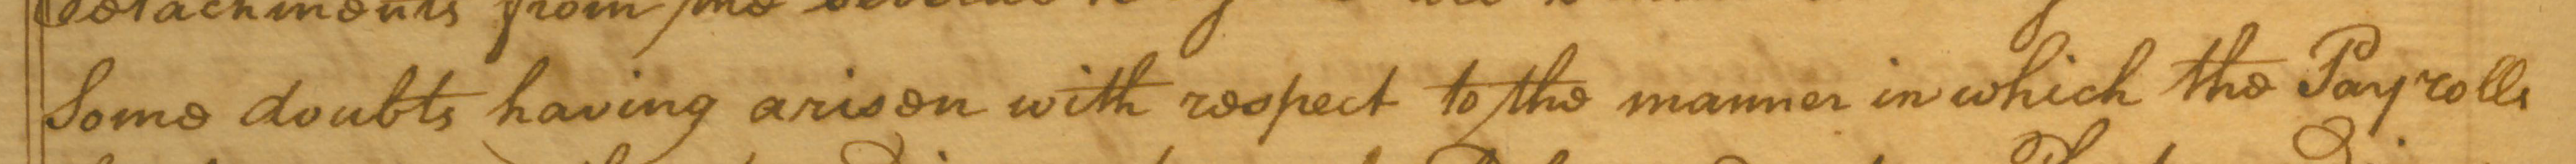Some doubts having arisen with respect to the manner in which the Payrolls
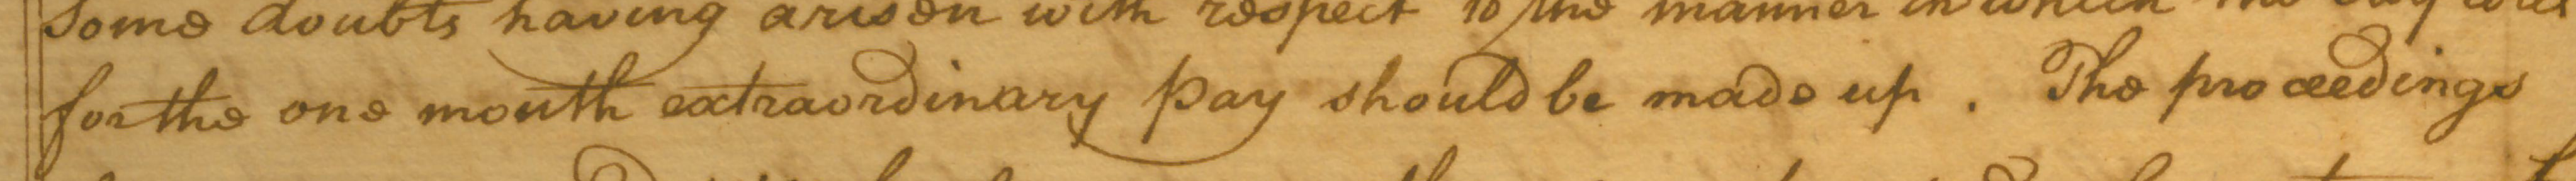for the one month extraordinary pay should be made up. The proceedings
